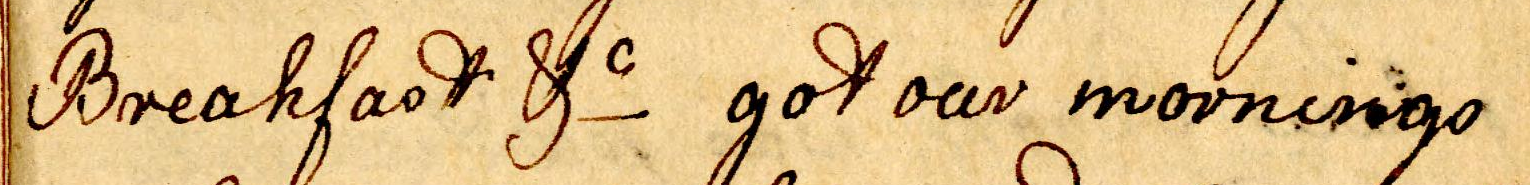Breakfast &^c got our mornings
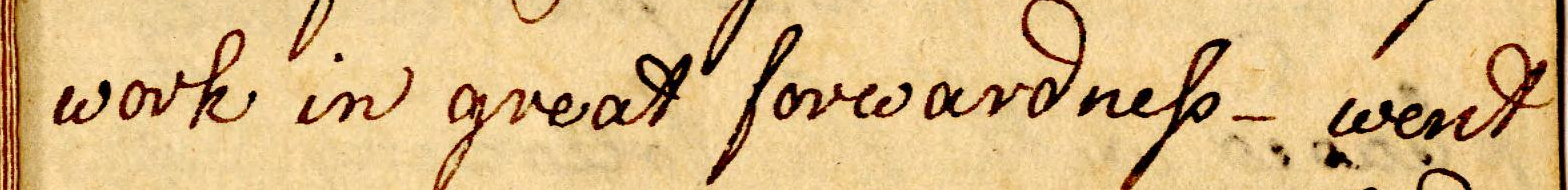work in great forwardness- went
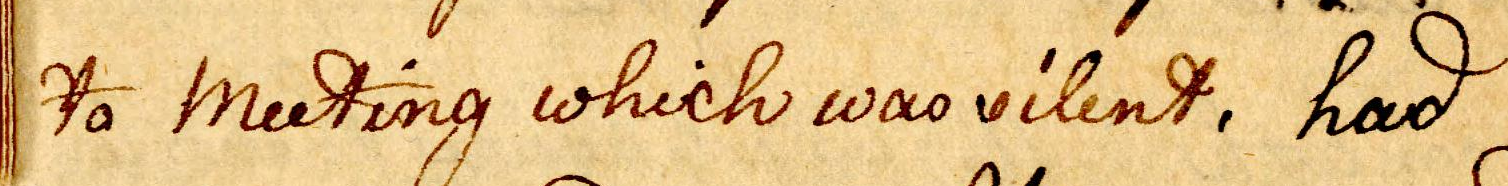to Meeting which was silent, had
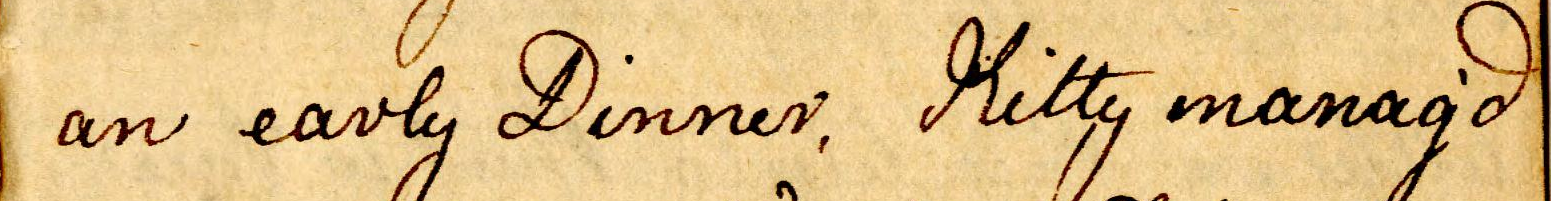an early Dinner, Kitty manag'd
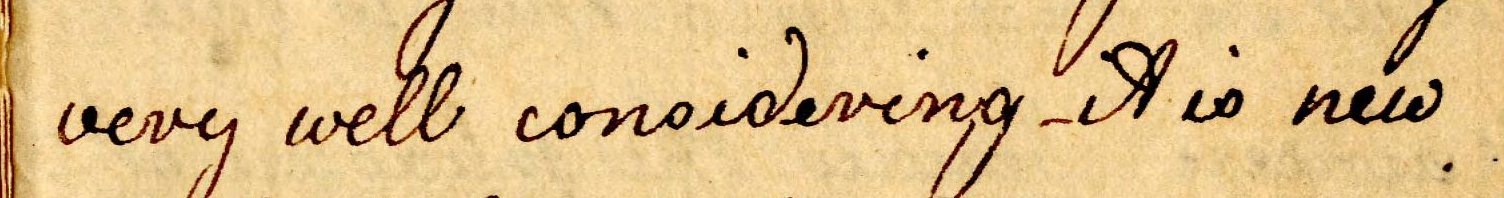very well considering it is new
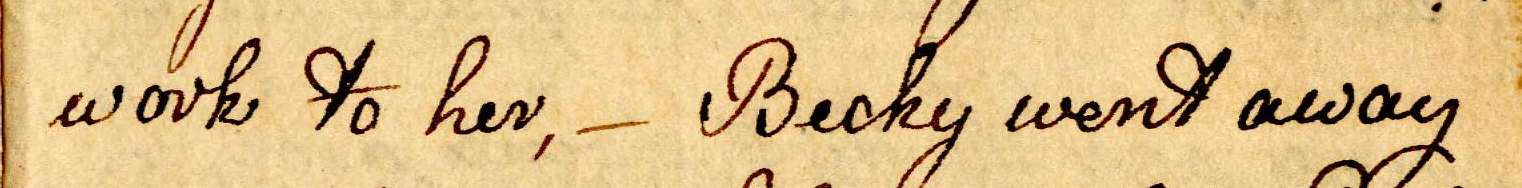worh to her,- Becky went away
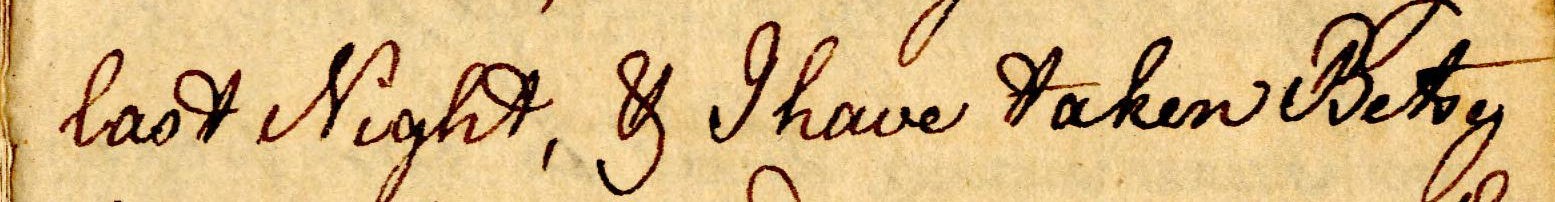last Night, & I have taken Betsy
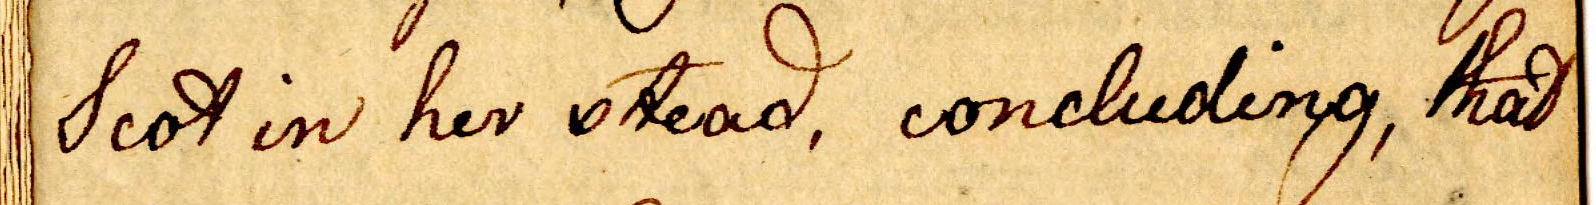Scot in her stead, concluding, that
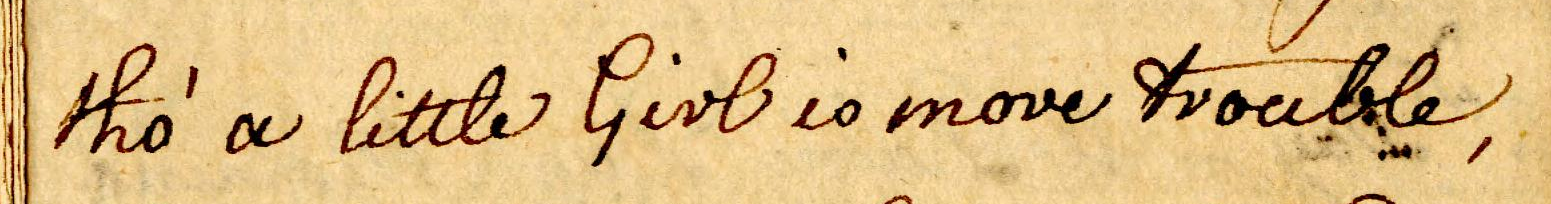tho' a little Girl is more trouble,
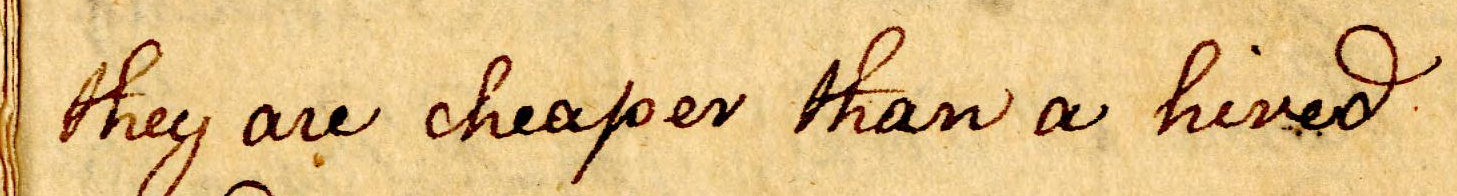they are cheaper than a hired
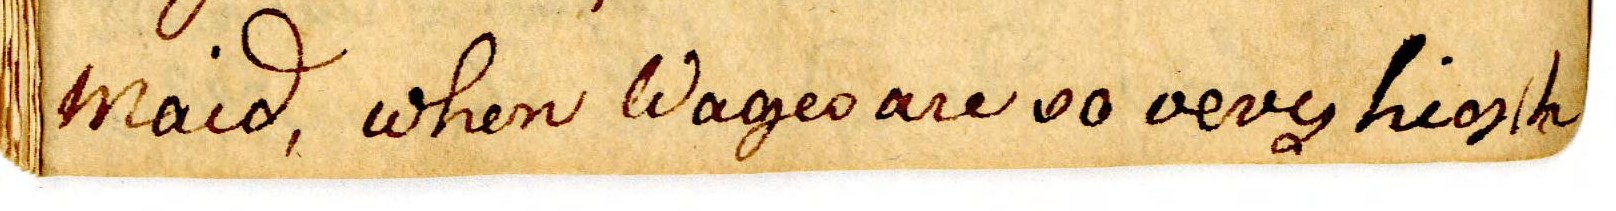Maid, when Wages are so very high
